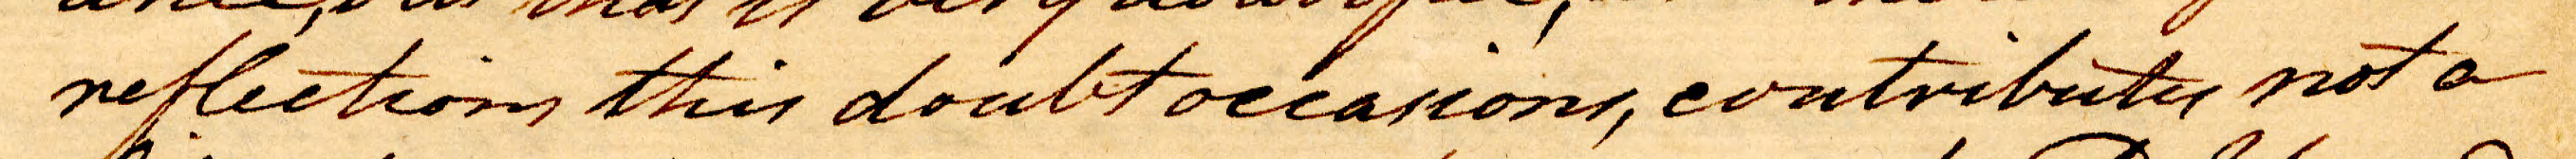reflections this doubt occasions, contributes not a
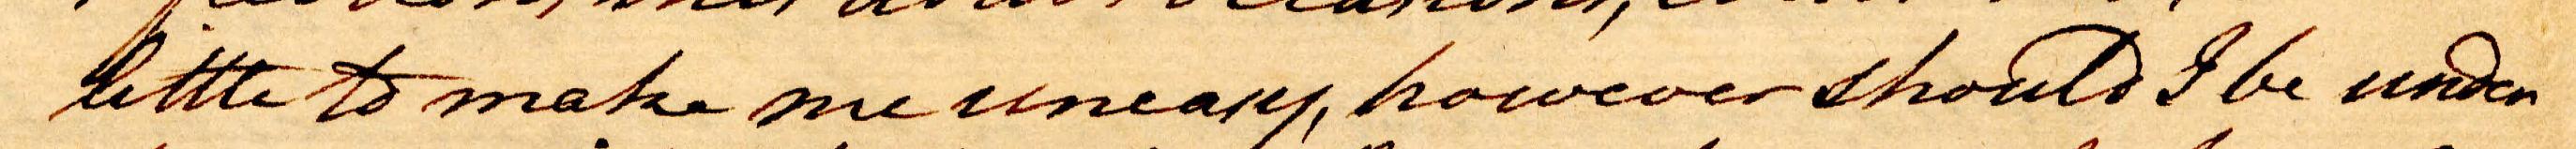little to make me uneasy, however should I be under
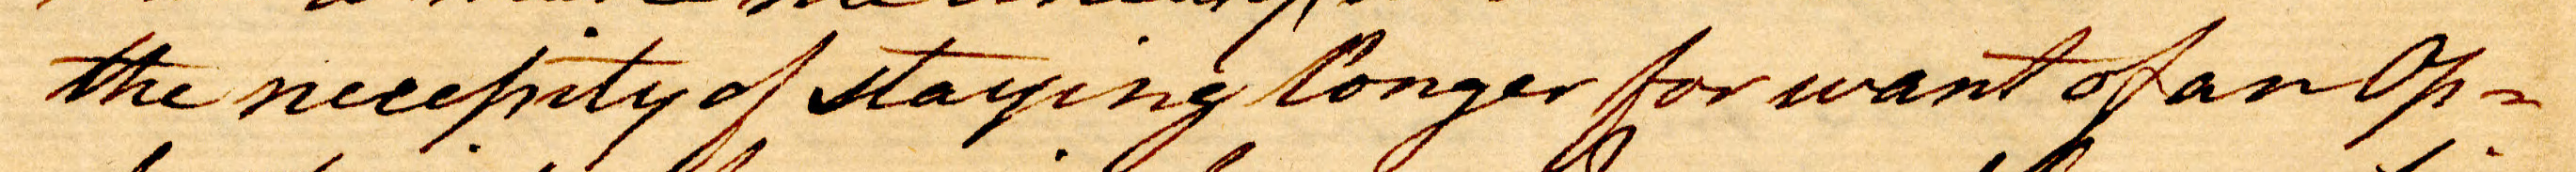the necessity of staying longer for want of an Op-
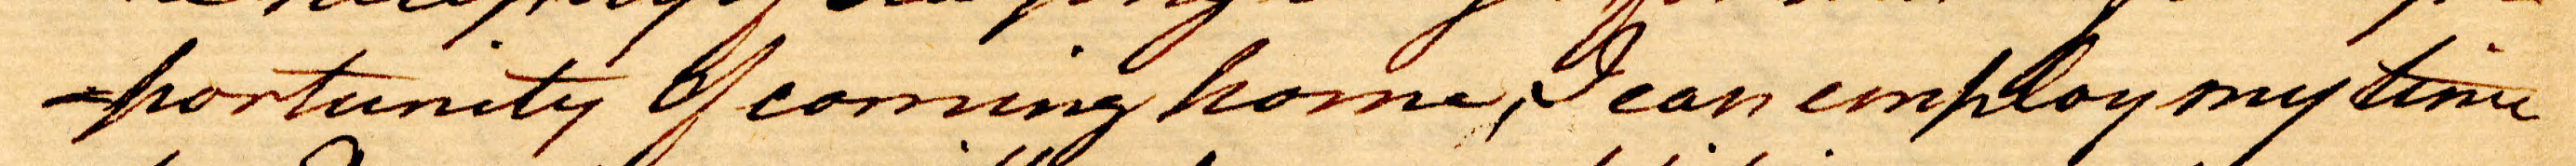-portunity of coming home, I can employ my time
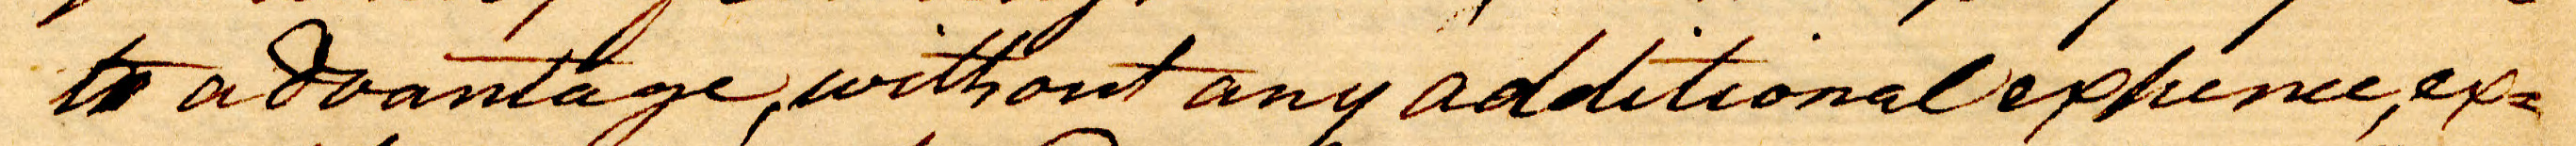to advantage, without any additional expence, ex-
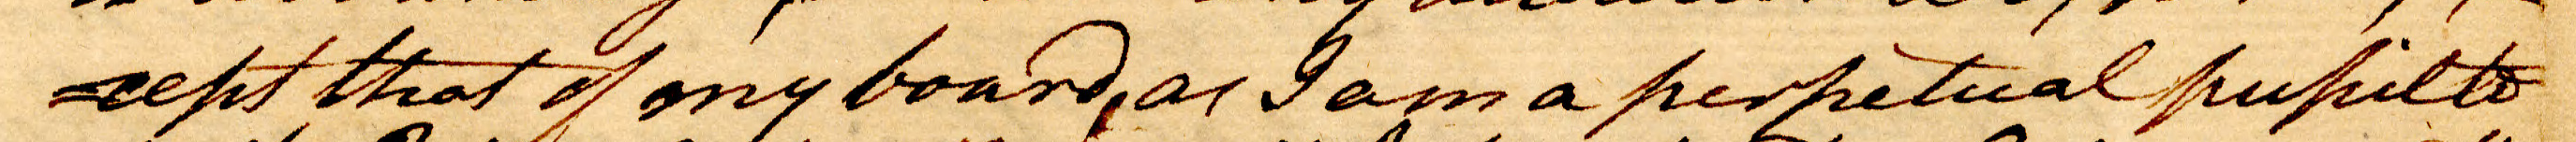-cept that of my board, as I am a perpetual pupil to
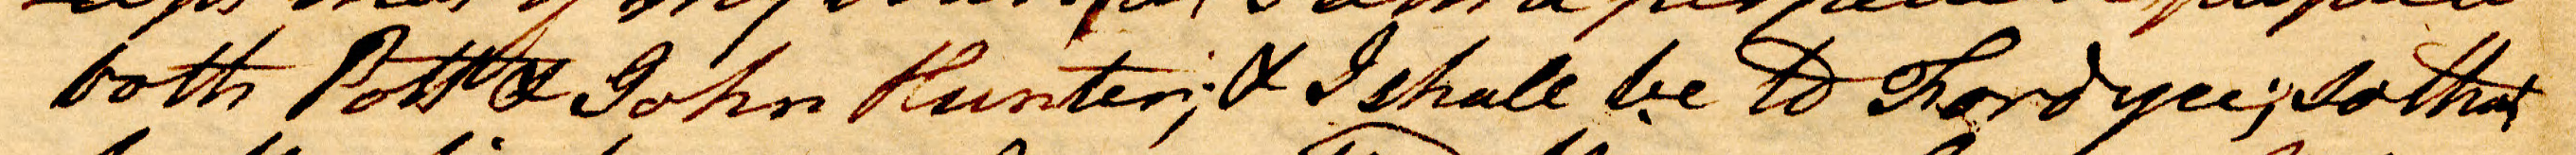both Potts & John Hunter; & I shall be to Fordyce; so that
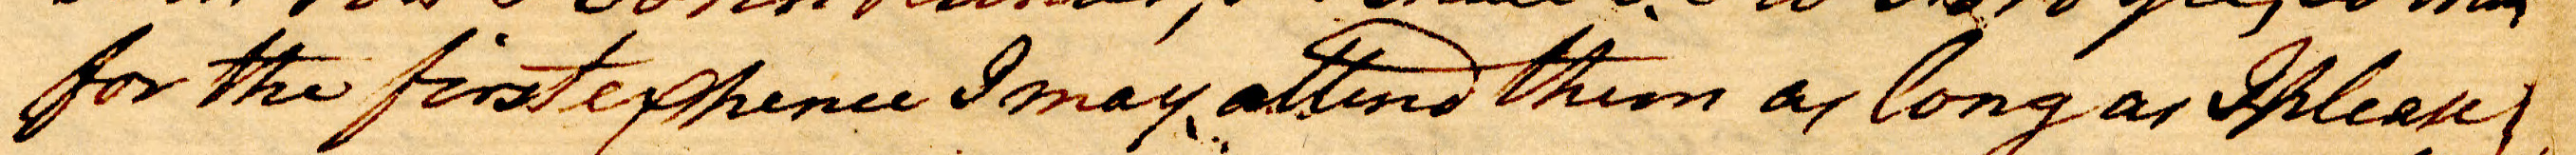for the first expence I may attend them as long as I please,
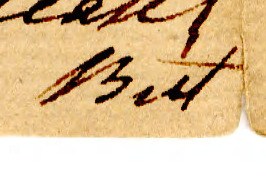But
